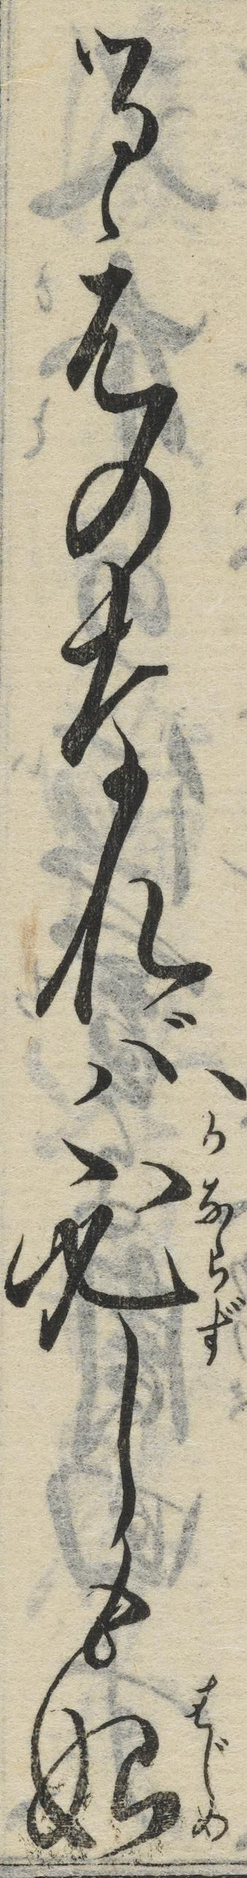るものなれば、必しも始
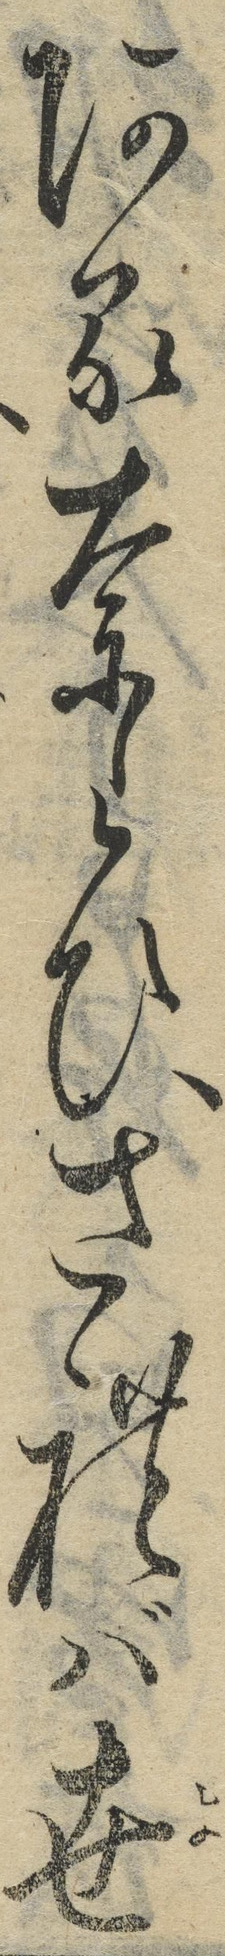あるならひ、されば世
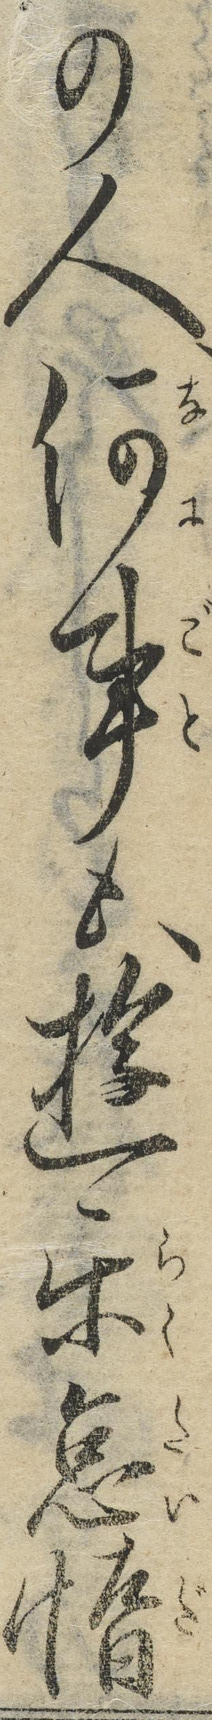の人、何事も、遊楽怠惰
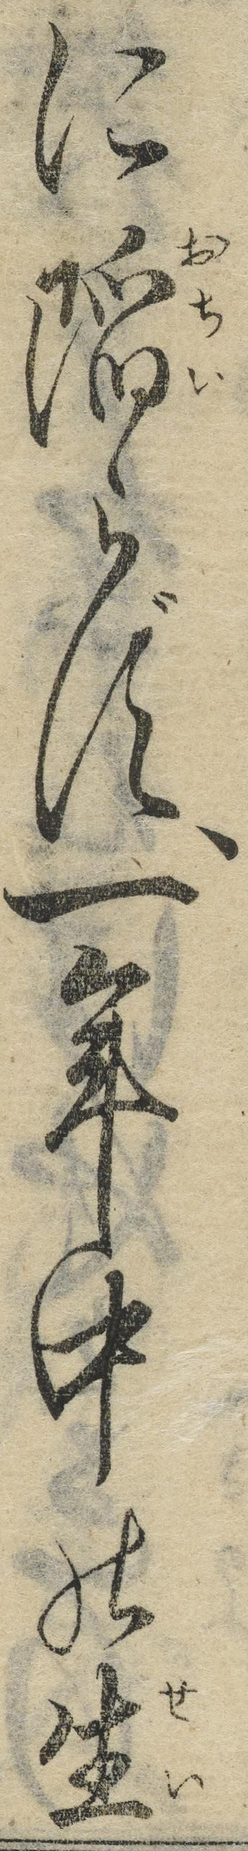に陥らず、一年中の生
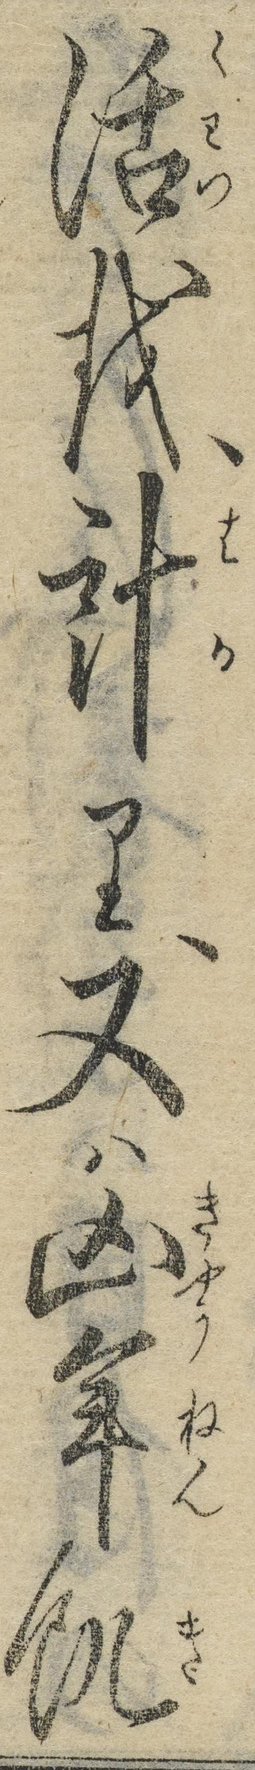活を、計り、又は凶年飢
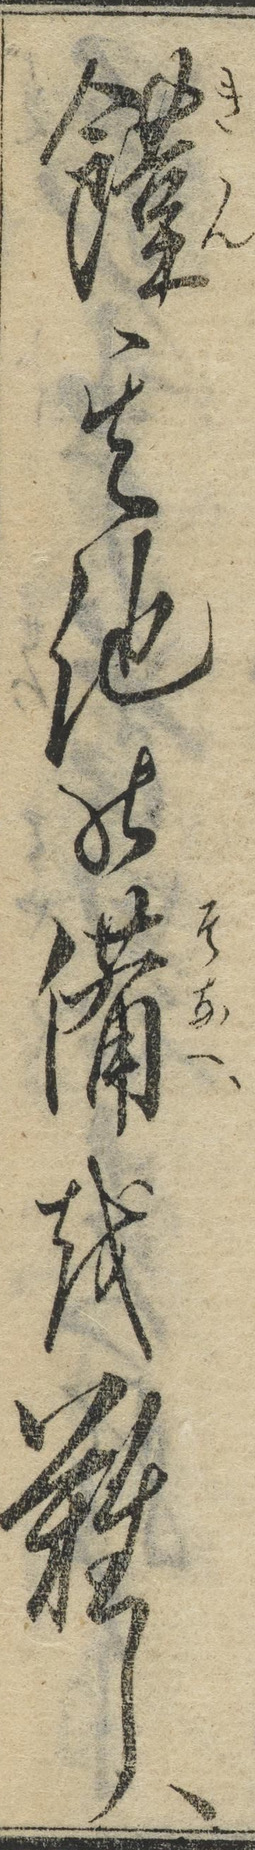饉其他の備をなし、

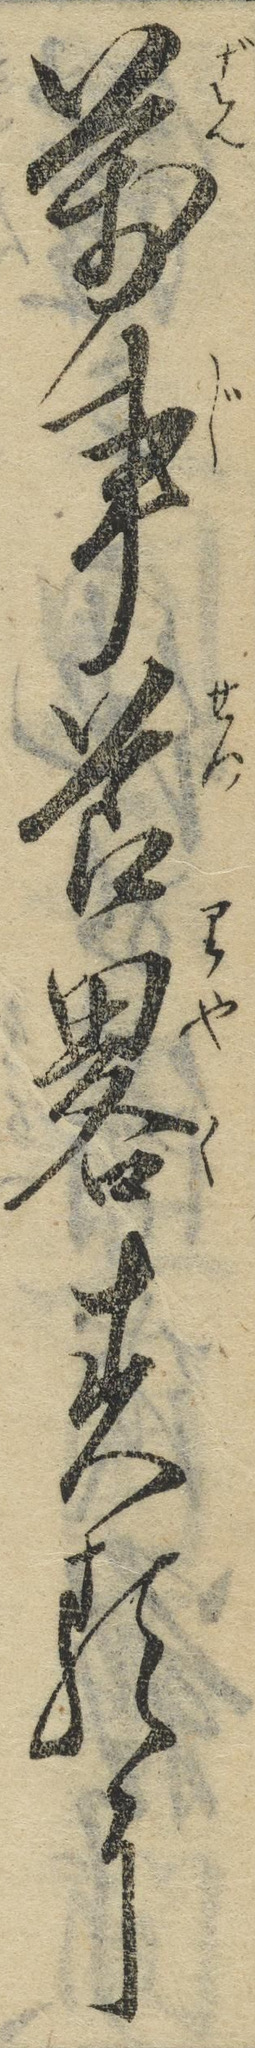万事節略するに
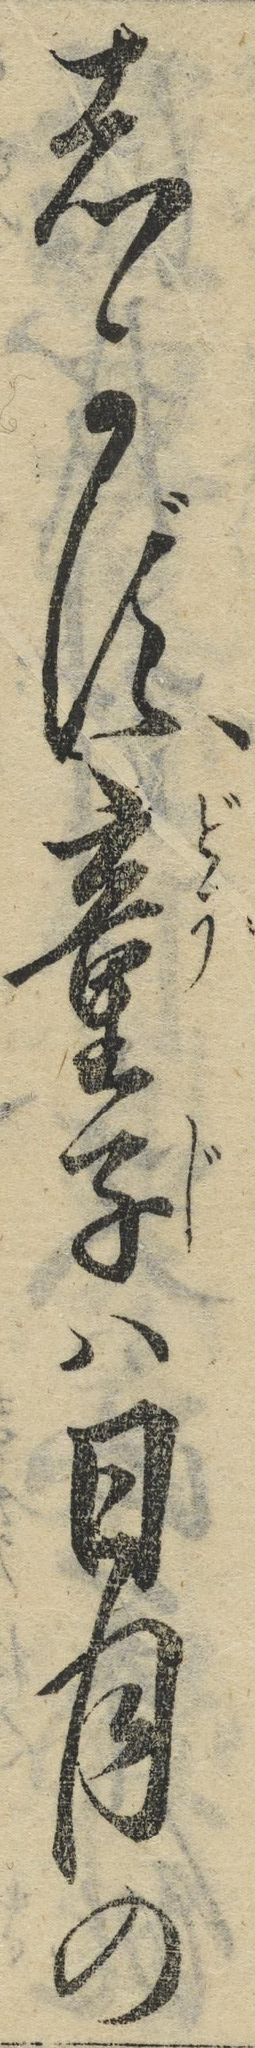しかず、童子は日月の
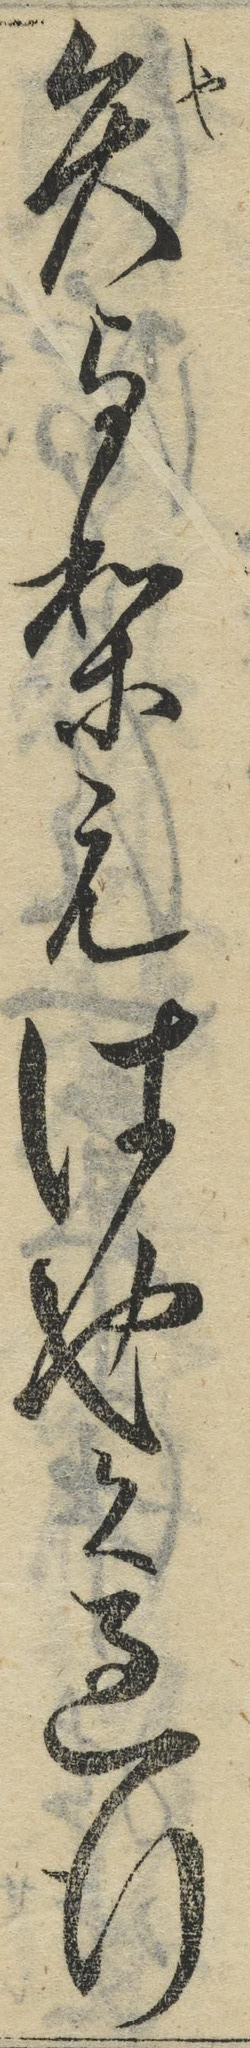矢よりもはやく過行
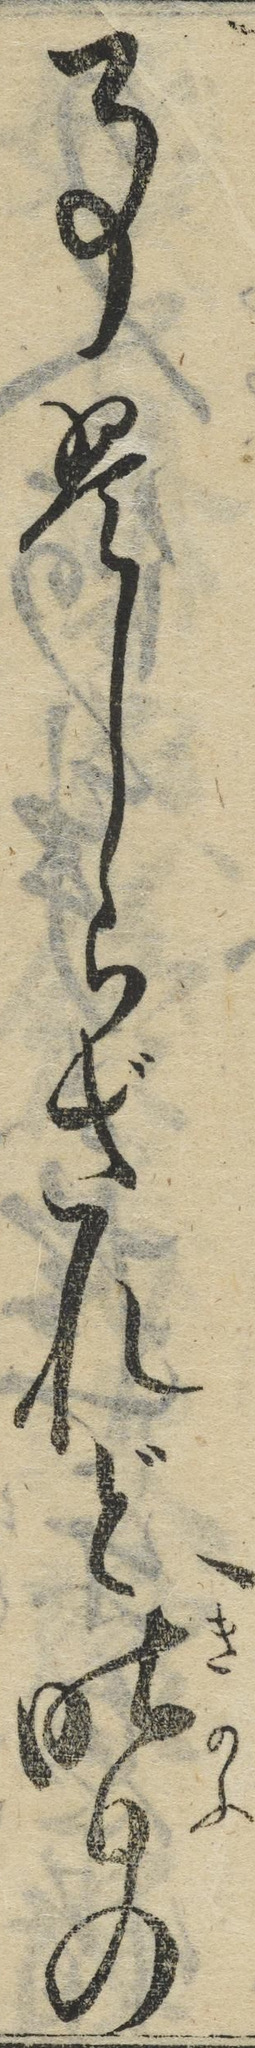事はしらざれど、昨日の
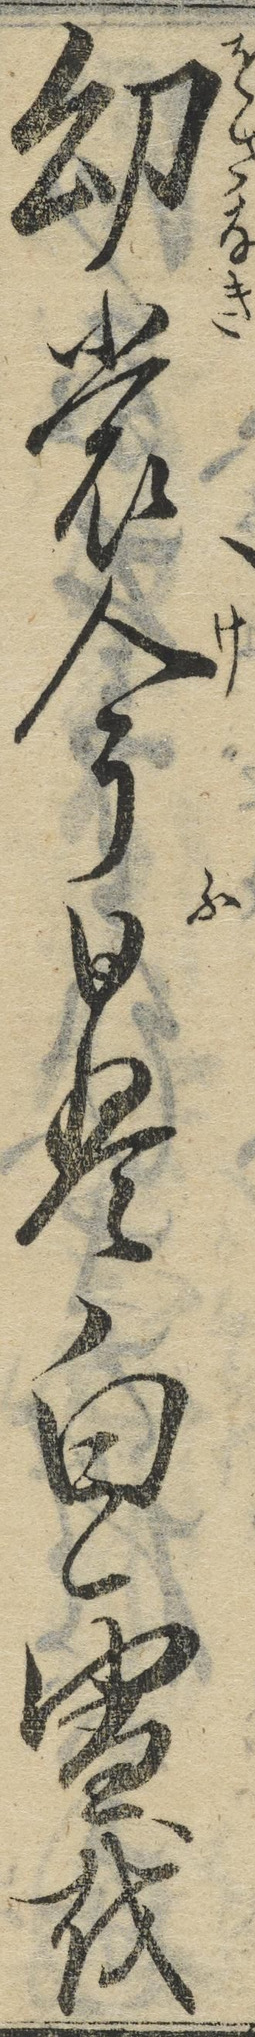幼も、今日は白雪を
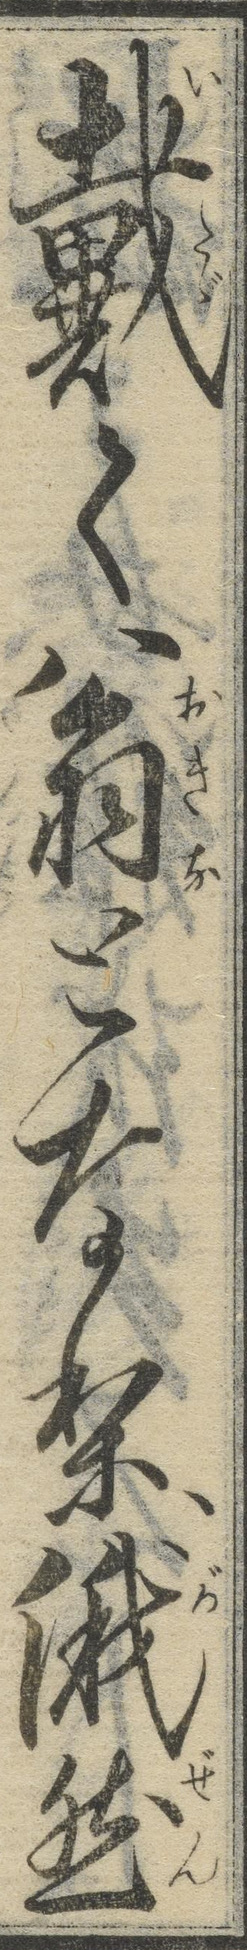戴く翁となり、俄然
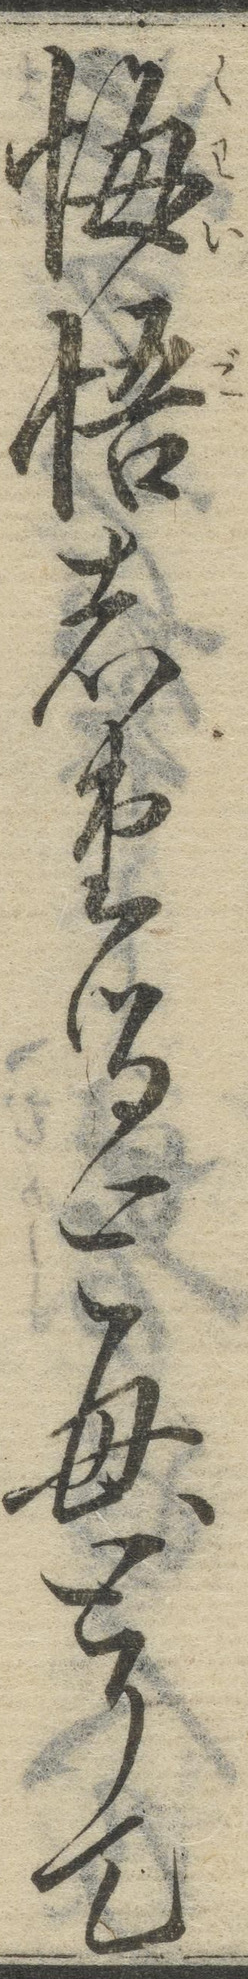悔悟したるとも、とりて
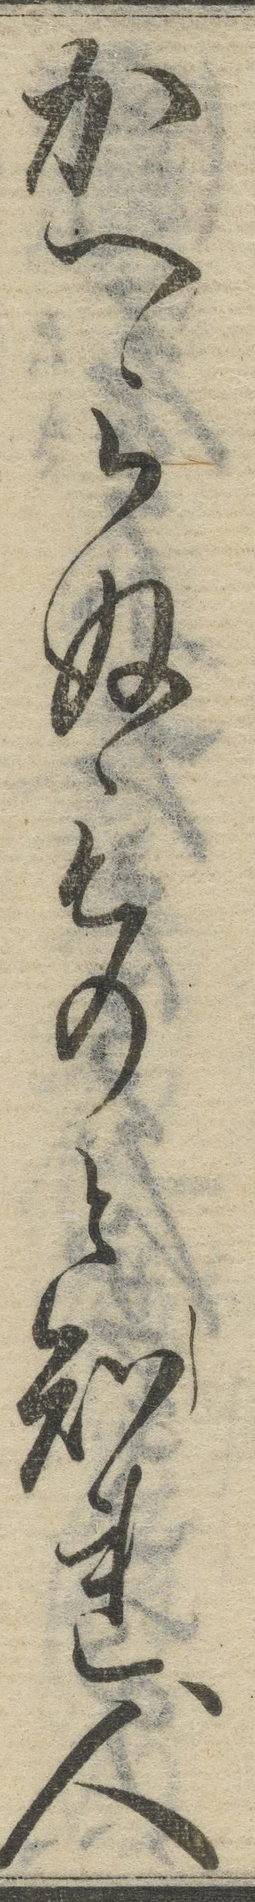かへらぬものと知れ、人
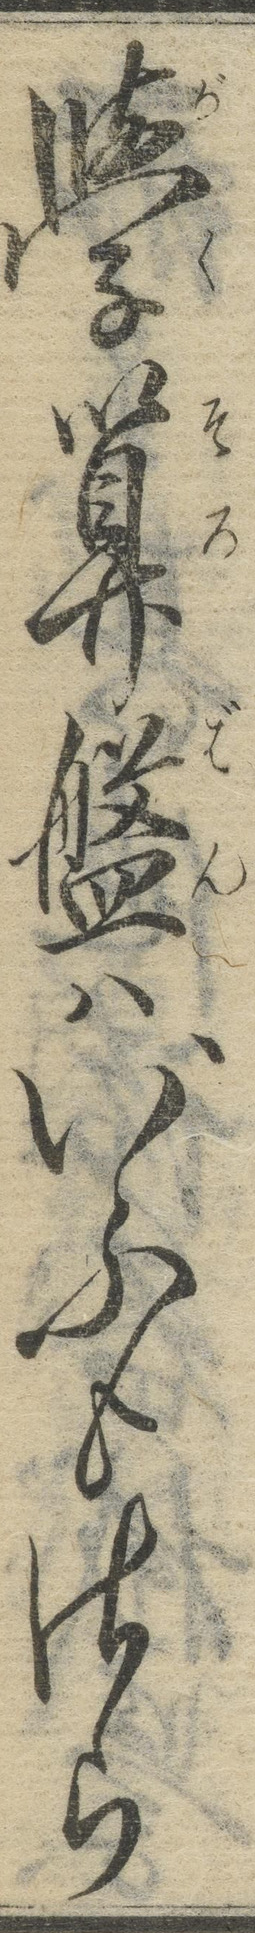学算盤は、いふもさら

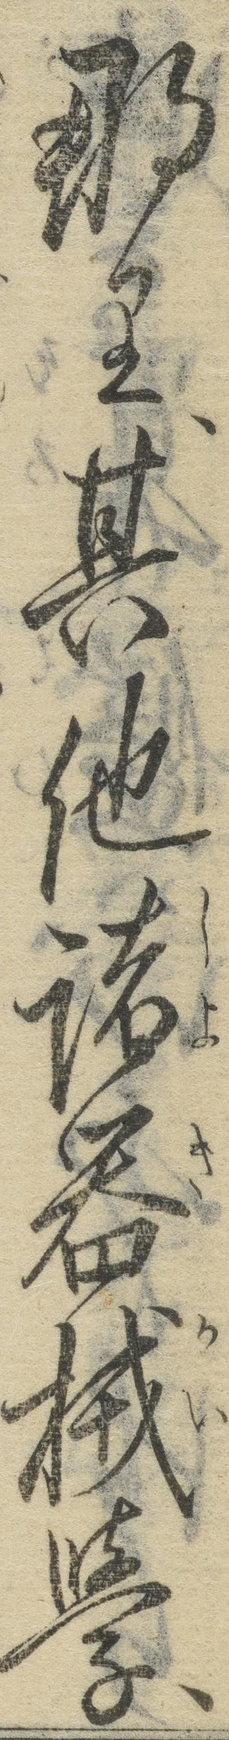なり、其他諸器械学、
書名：暦日往来　單
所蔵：東京大学地震研究所図書室 Earthquake Research Institute Library, The University of Tokyo, JAPAN
